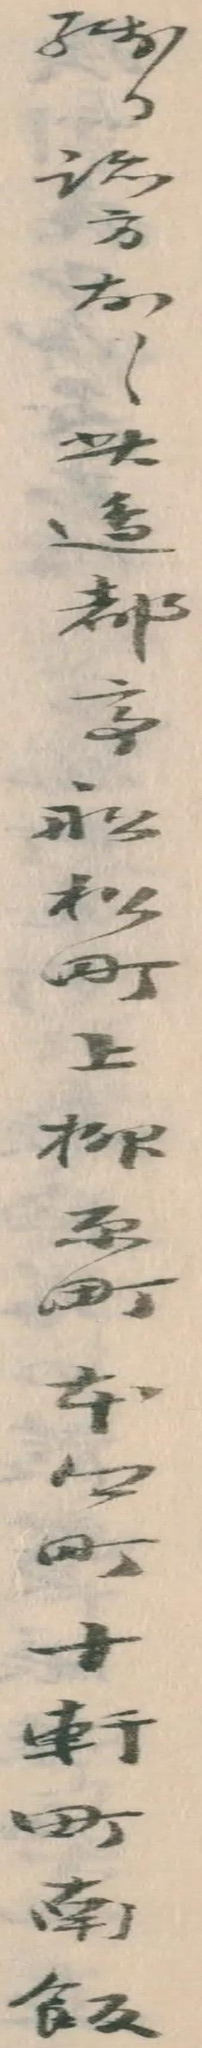残り跡方なし此辺都て船松町上柳原町本郷町十軒町南飯
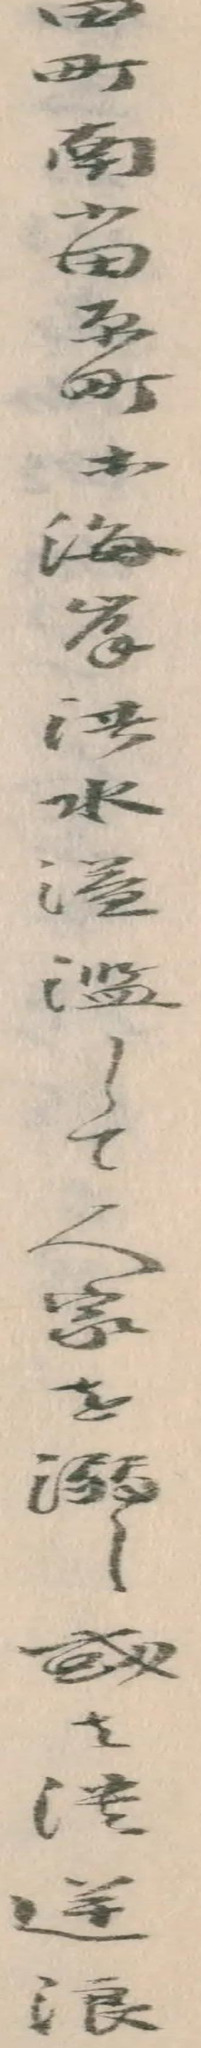田町南小田原町等海岸洪水溢濫して人家を溺し或は潰逆浪
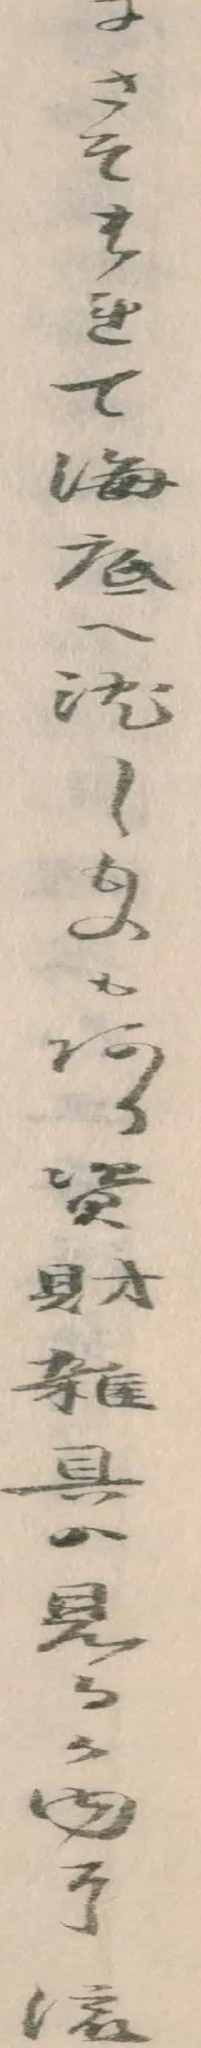にさそはれて海底へ沈しものもあり資財雑具の見るか内に流
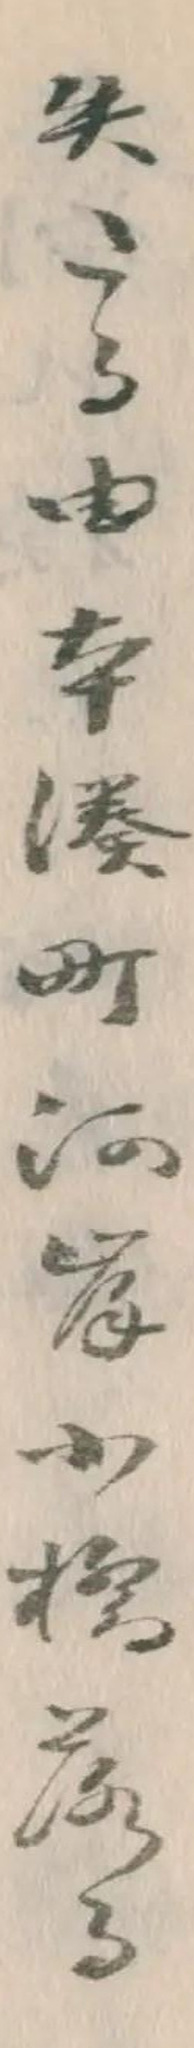失たる由本湊町河岸小橋落る
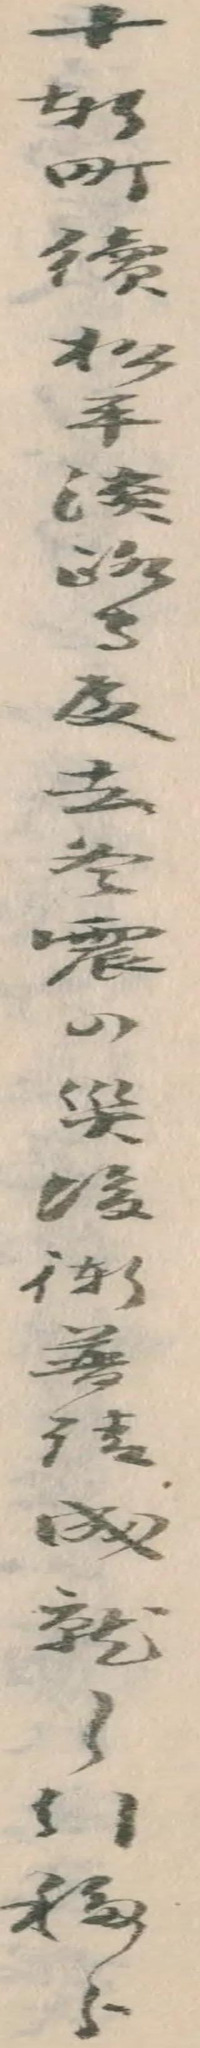十軒町続松平淡路守殿去冬震の災後漸普請成就し引移ら
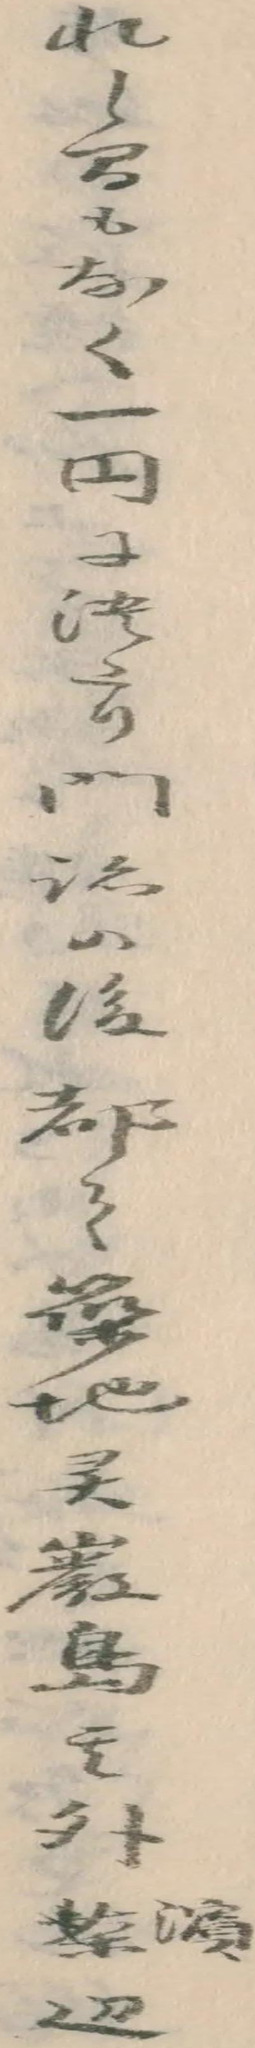れし間もなく一円に潰たり門跡の後都て築地霊巖島其外浜辺

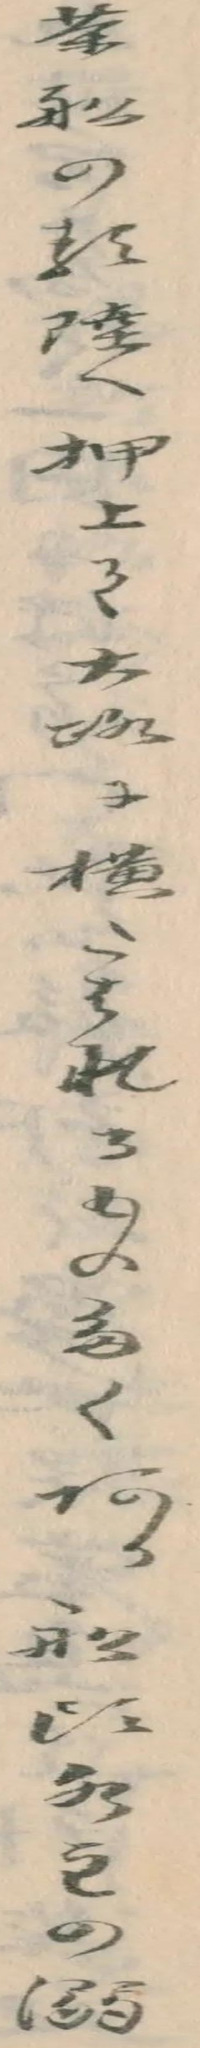茶船の類陸へ押上て大路に横たはれるもの多くあり船頭水主の溺
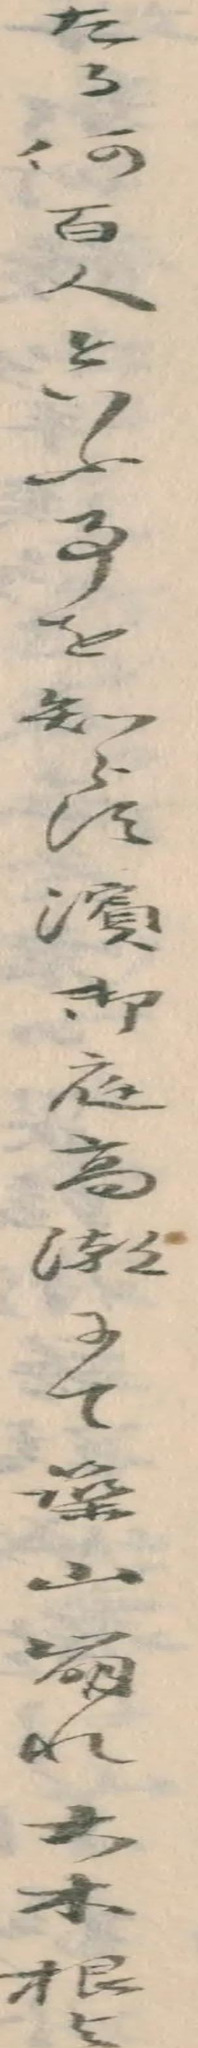たる何百人といふ事を知らす浜御庭高潮にて築山崩大木根よ
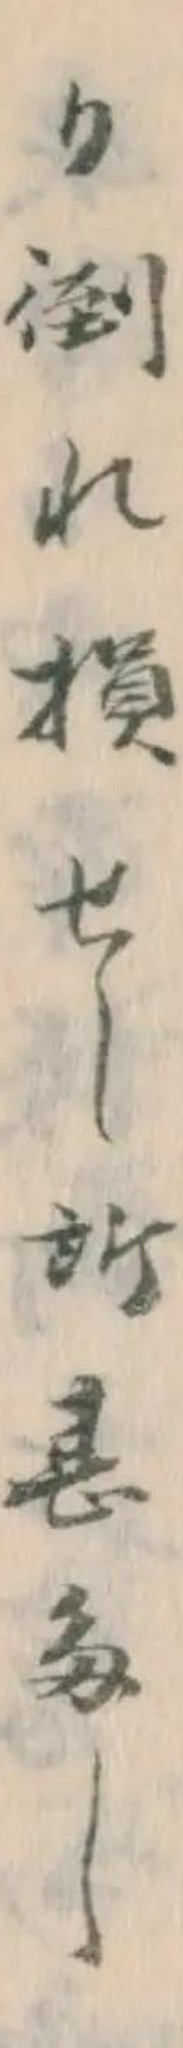り倒れ損せし所甚多し
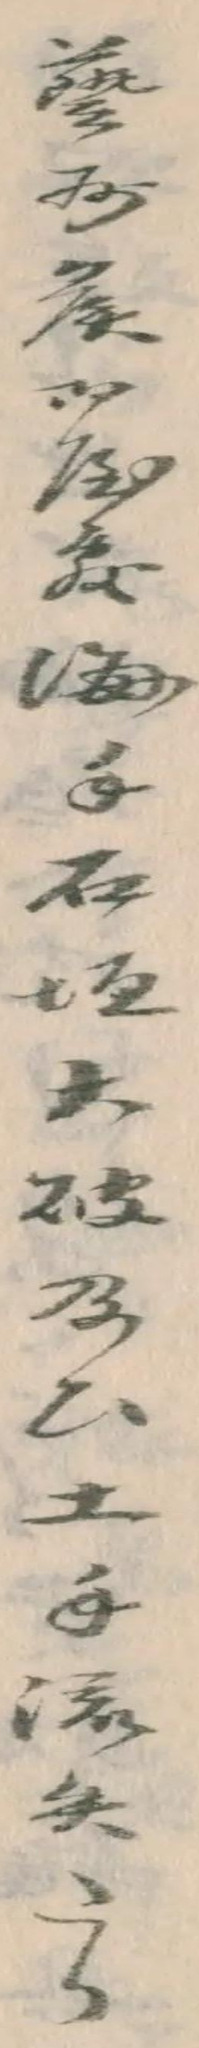芸州侯御屋敷海手石垣大破及ひ土手流失たり
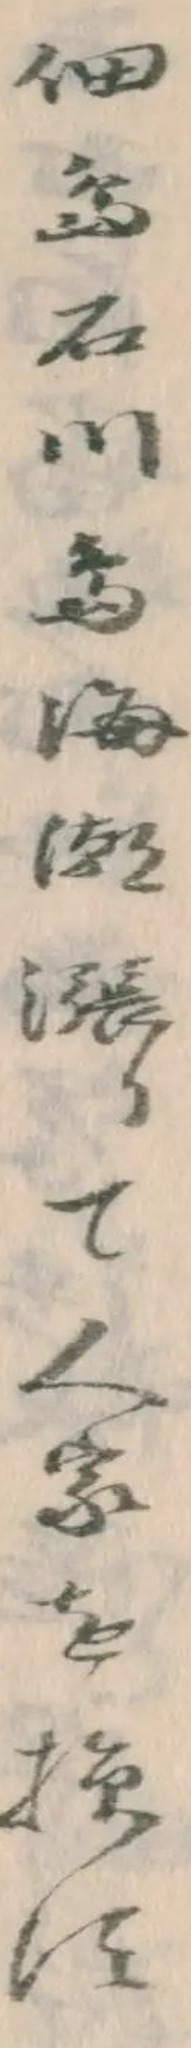佃島石川島海潮漲りて人家を損す
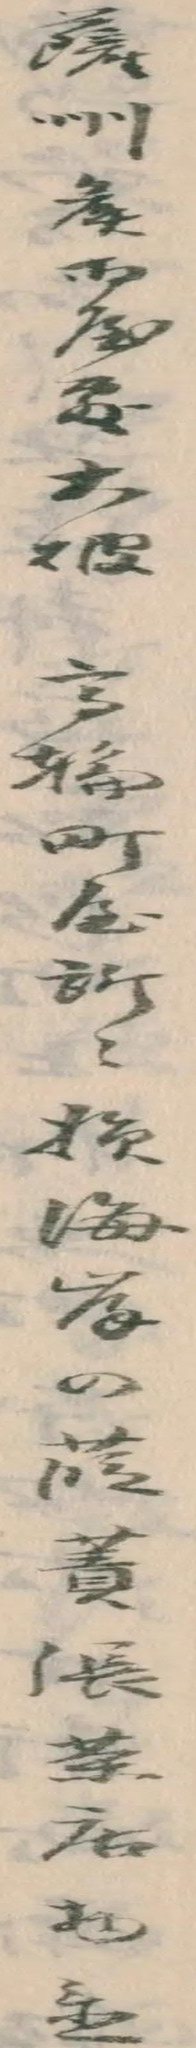薩州侯御屋敷大破高輪町屋所々損海岸の葭簀張茶店物置
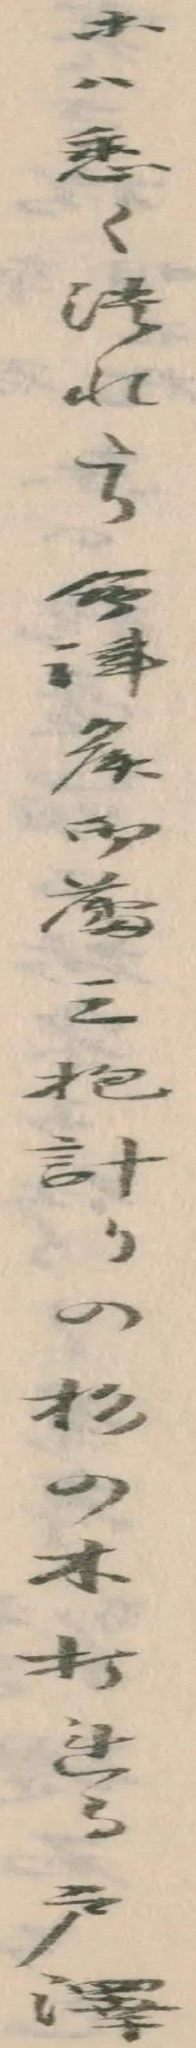等は悉く潰れたり会津侯御藩三抱計りの杉の木折れる戸沢
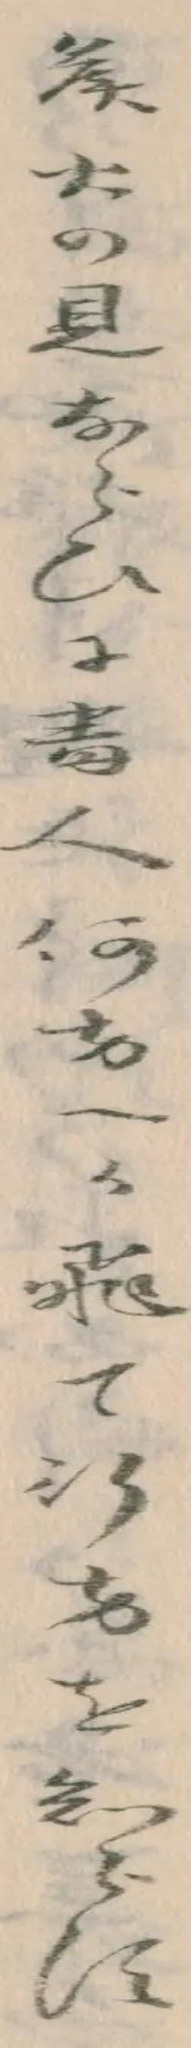侯火の見ならひに番人何方へか飛て行方を知らす
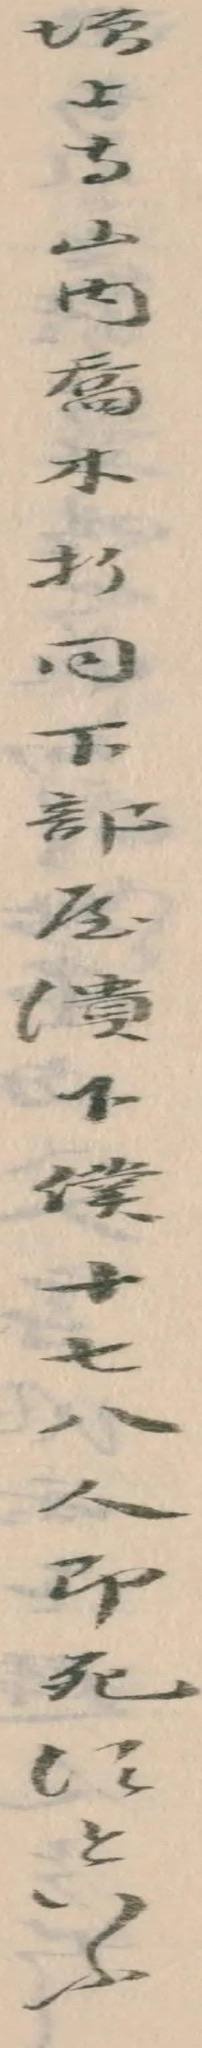増上寺山内喬木折同下部屋潰下僕十七八人即死すといふ
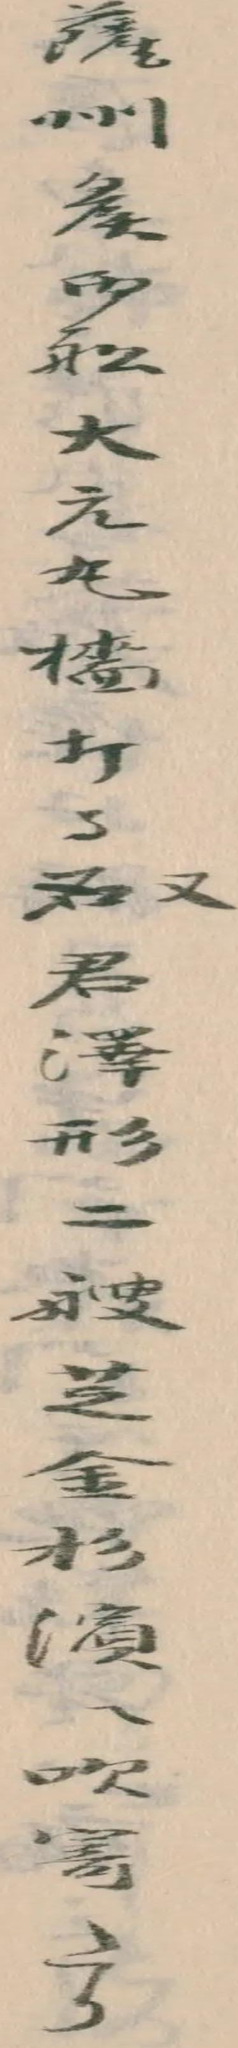薩州侯御船大元丸檣折る又君沢形二艘芝金杉浜へ吹寄たり
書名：地災撮要. 巻10(地震之部) 上,下
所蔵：国立国会図書館 National Diet Library, JAPAN
